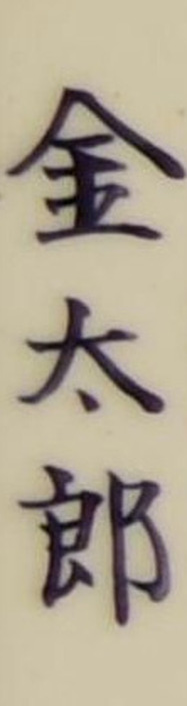金太郎

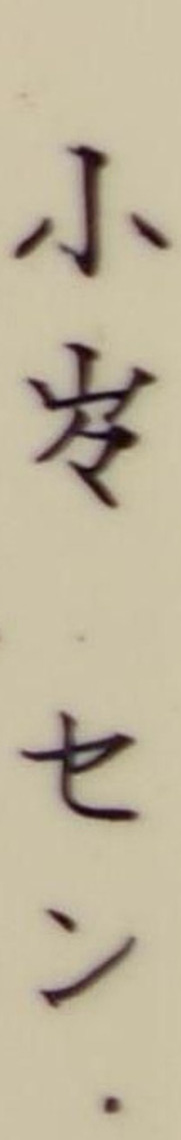小山セン
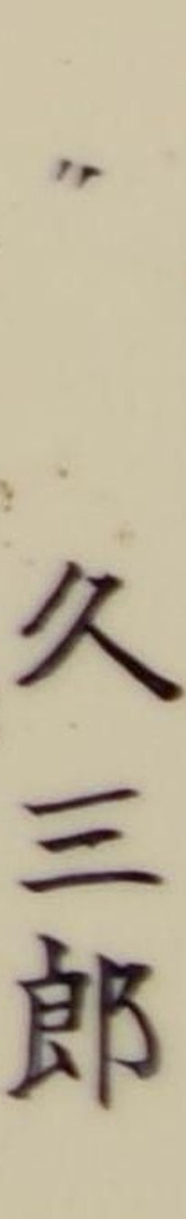久三郎
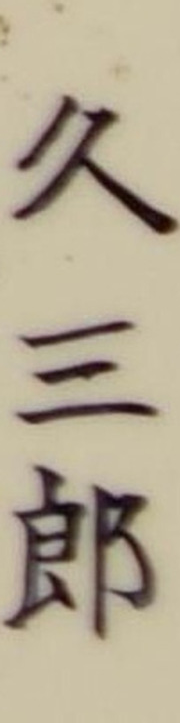久三郎
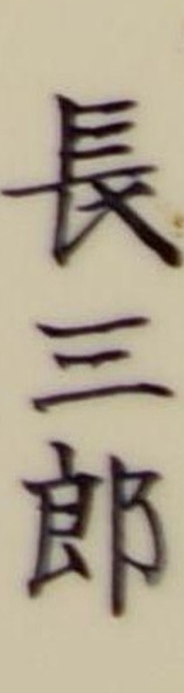長三郎
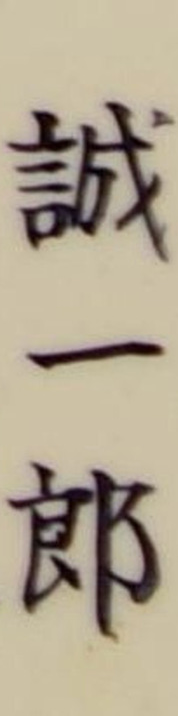誠一郎
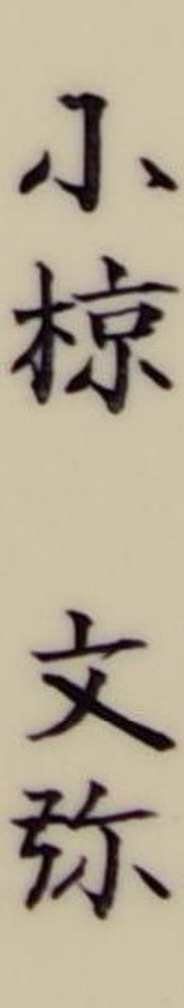小椋文弥
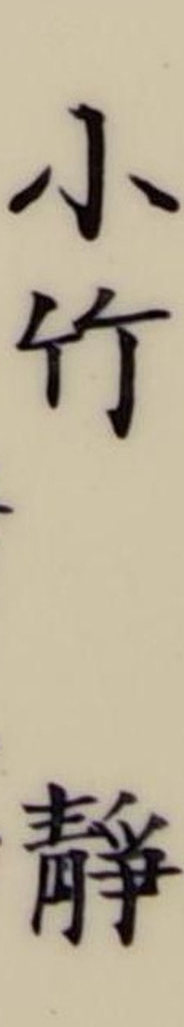小竹静
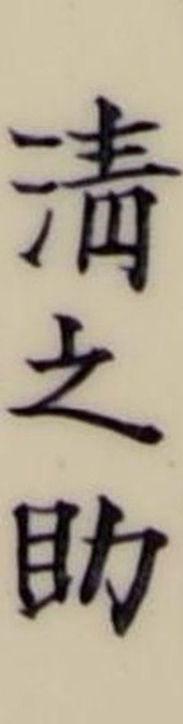清之助
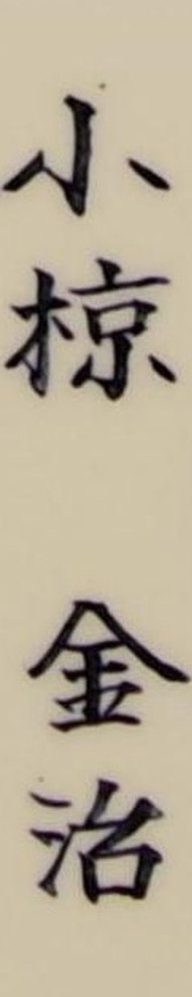小椋金治
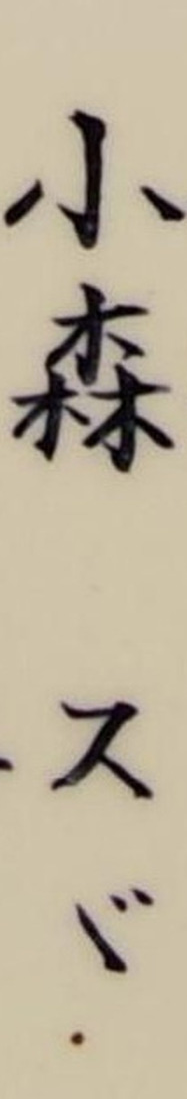小森スゞ
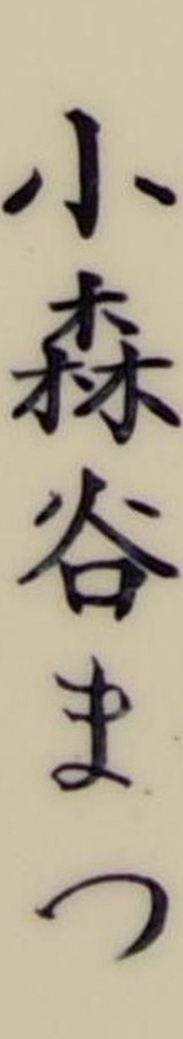小森谷まつ
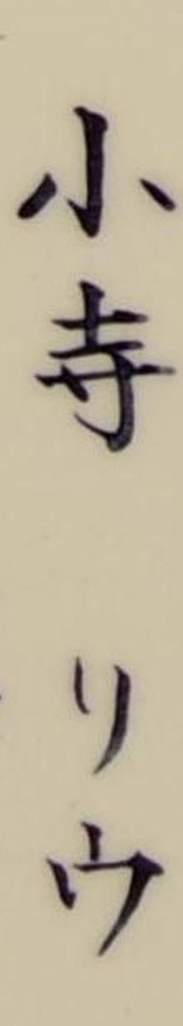小寺リウ
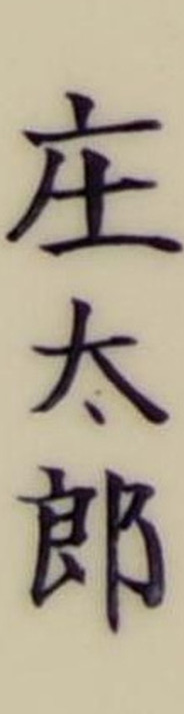庄太郎
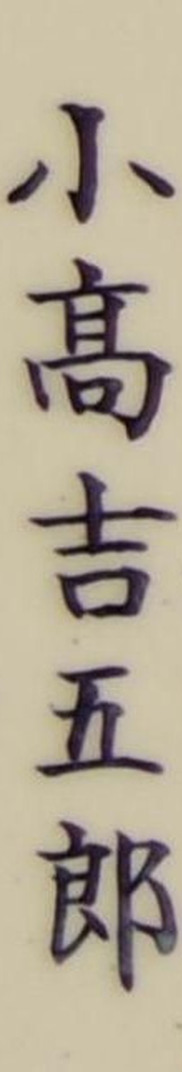小高吉五郎

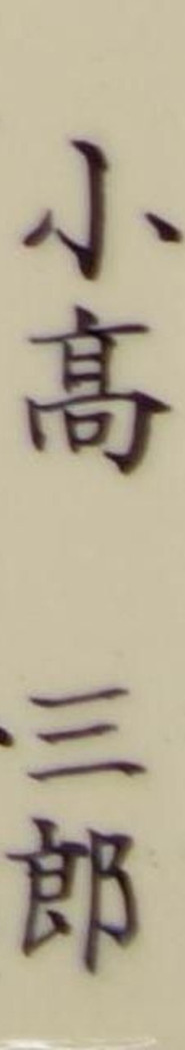小高三郎
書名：E~L
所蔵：高野山金剛峯寺
